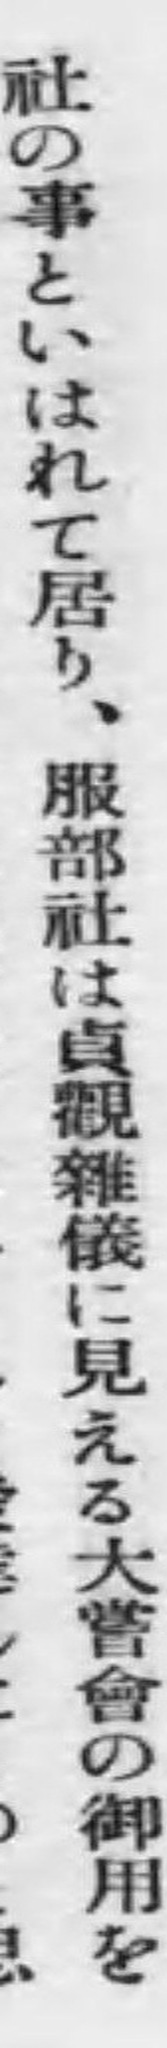社の事といはれて居り、服部社は貞観雑儀に見える大嘗会の御用を
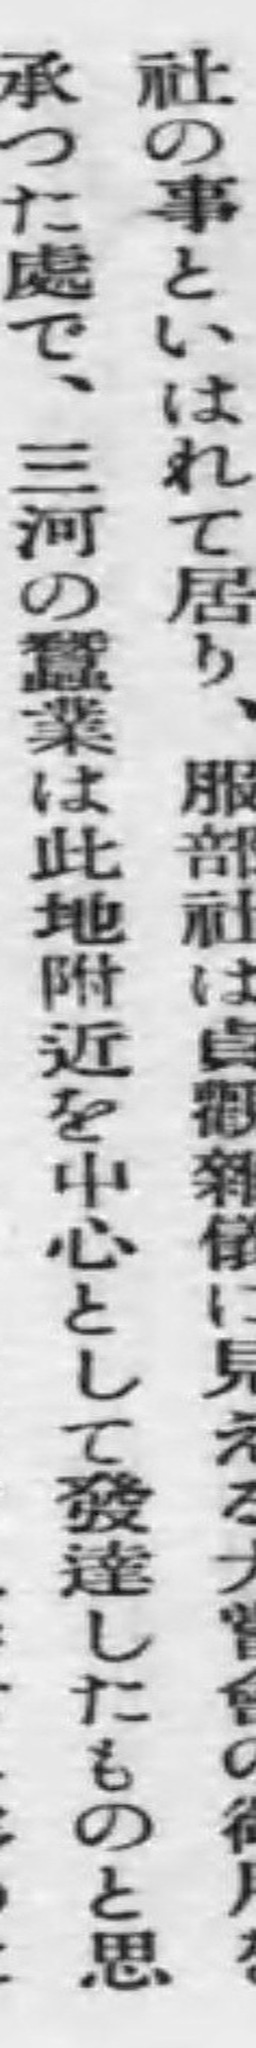承つた処で、三河の蚕業は此地附近を中心として発達したものと思
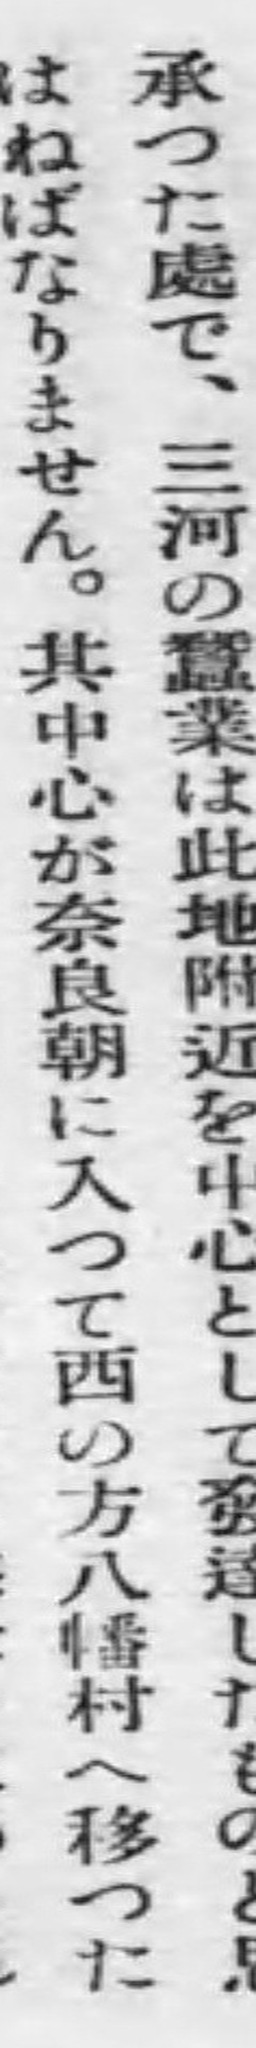はねばなりません。其中心が奈良朝に入つて西の方八幡村へ移つた
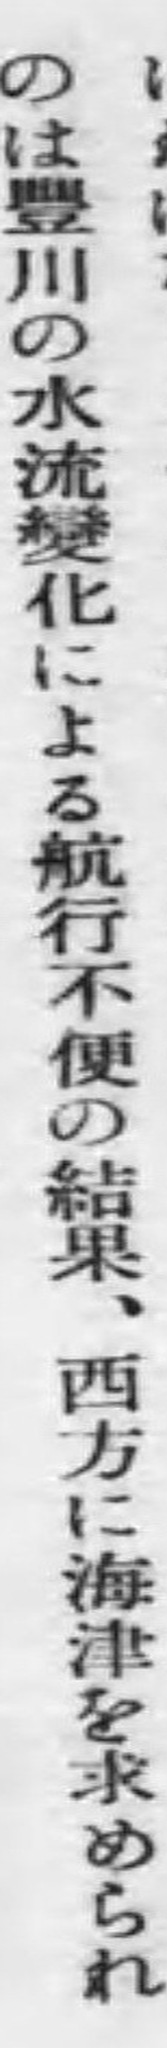のは豊川の水流変化による航行不便の結果、西方に海津を求められ
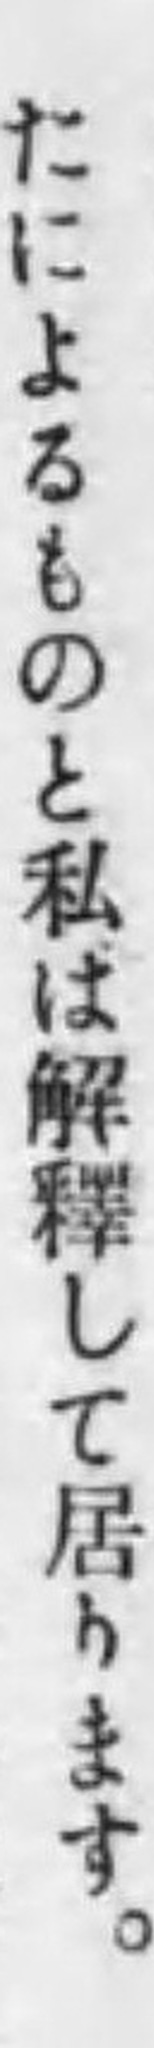たによるものと私は解釈して居ります。
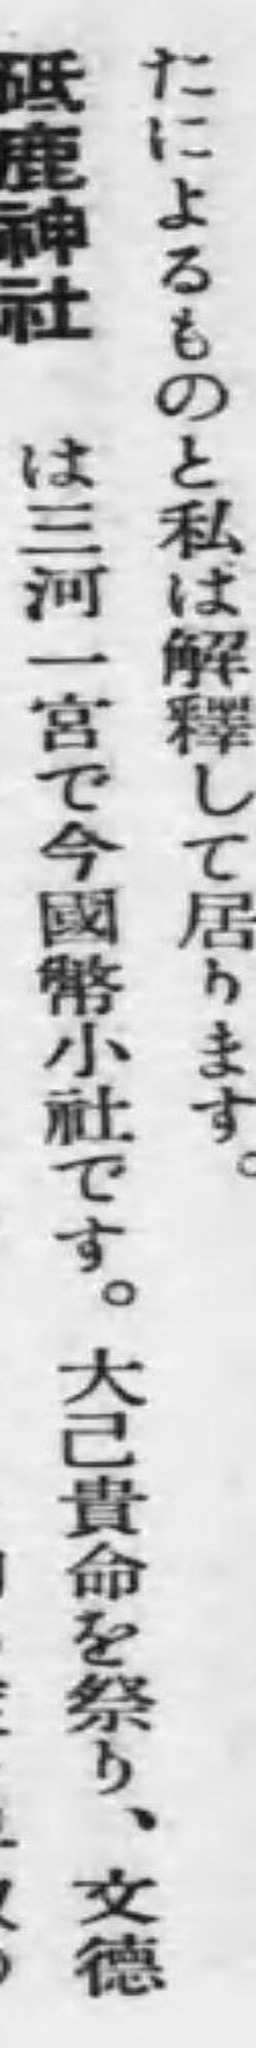砥鹿神社は三河一宮で今国幣小社です。大己貴命を祭り、文徳
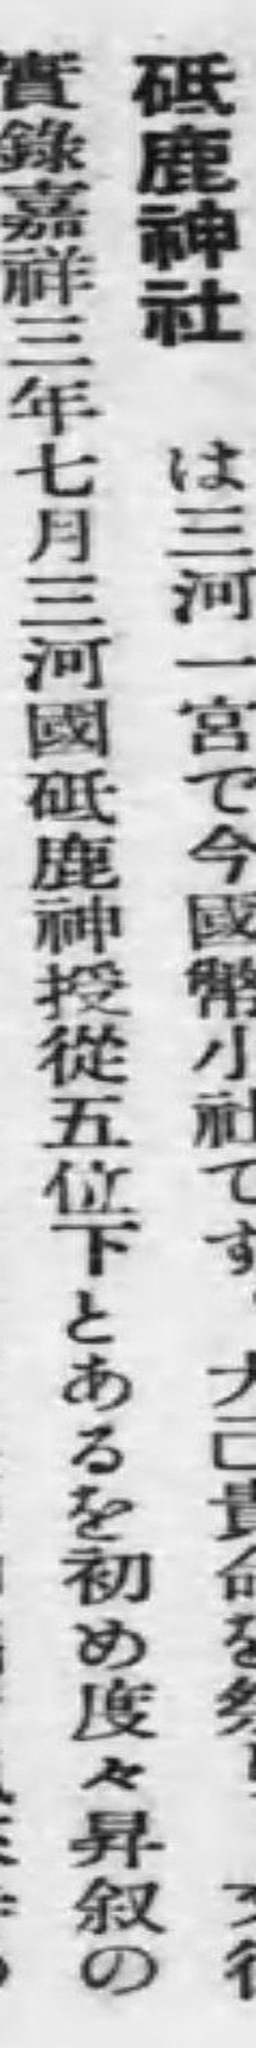実録嘉祥三年七月三河国砥鹿神授従五位下とあるを初め度々昇叙の
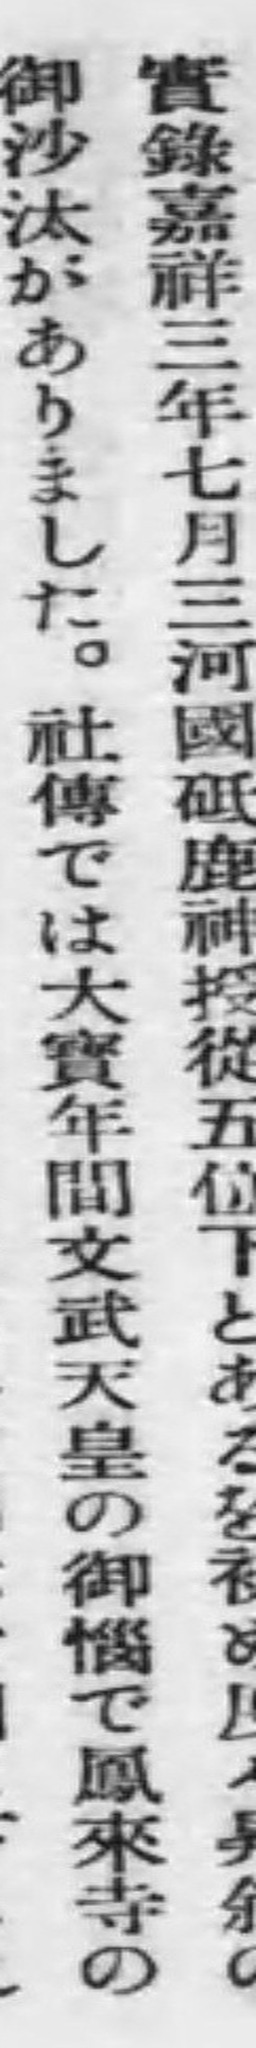御沙汰がありました。社伝では大宝年間文武天皇の御悩で鳳来寺の
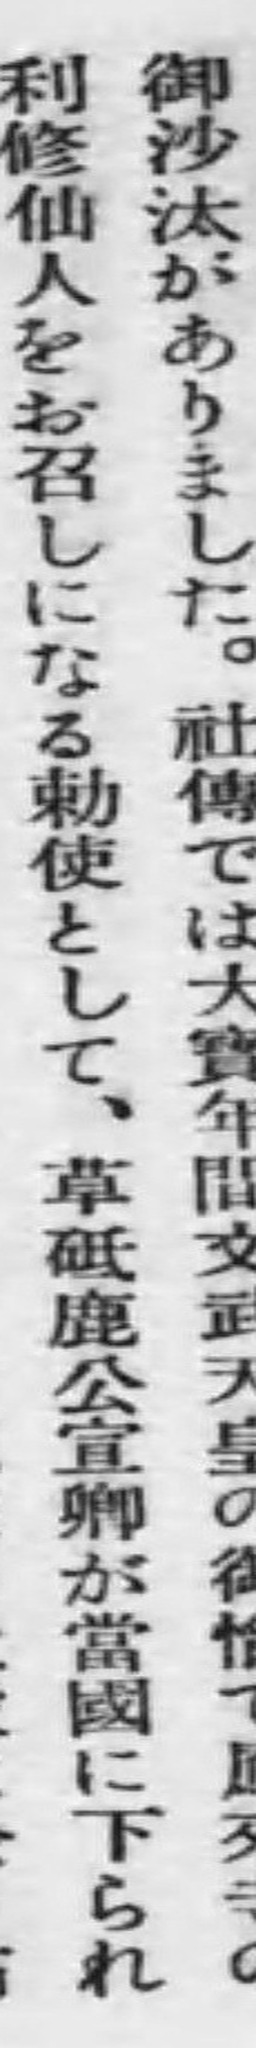利修仙人をお召しになる勅使として、草砥鹿公宣卿が当国に下られ
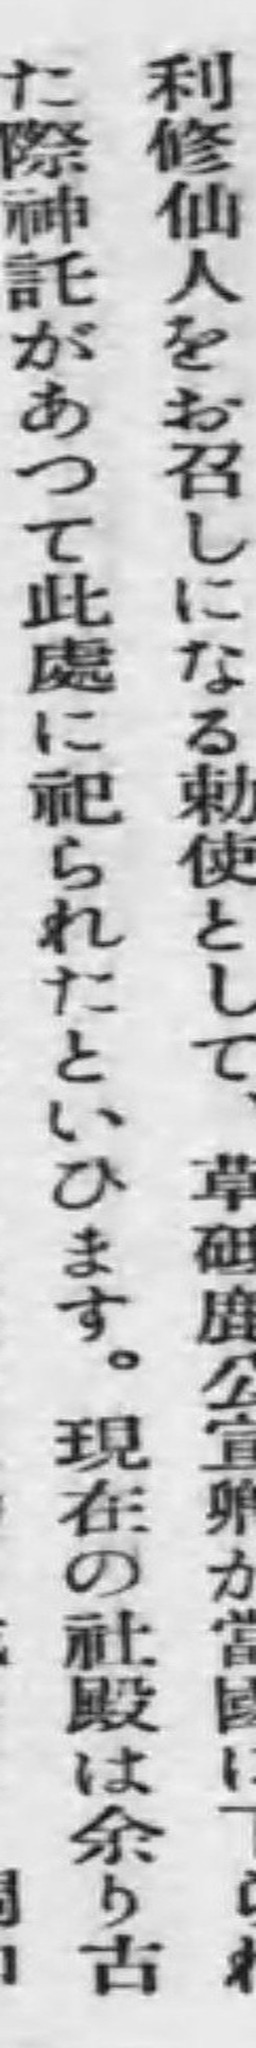た際神託があつて此処に祀られたといひます。現在の社殿は余り古
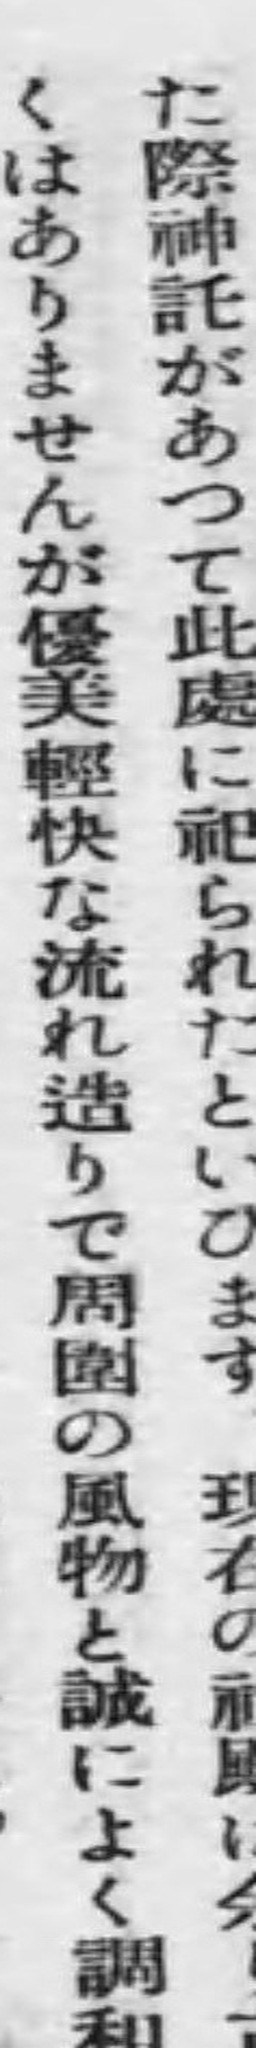くはありませんが優美軽快な流れ造りで周囲の風物と誠によく調和
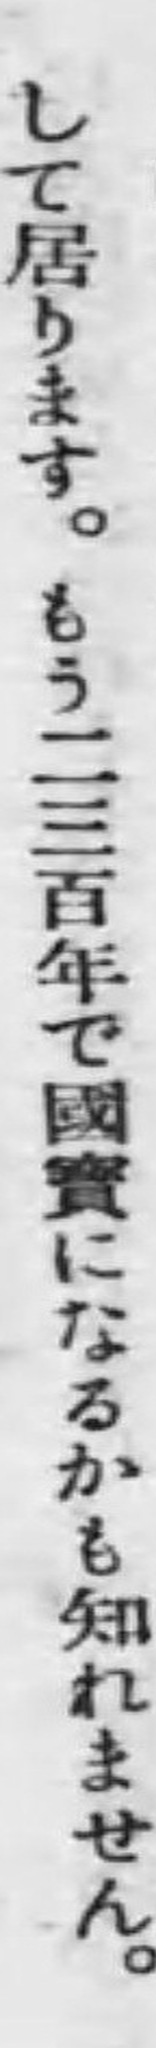して居ります。もう二三百年で国宝になるかも知れません。
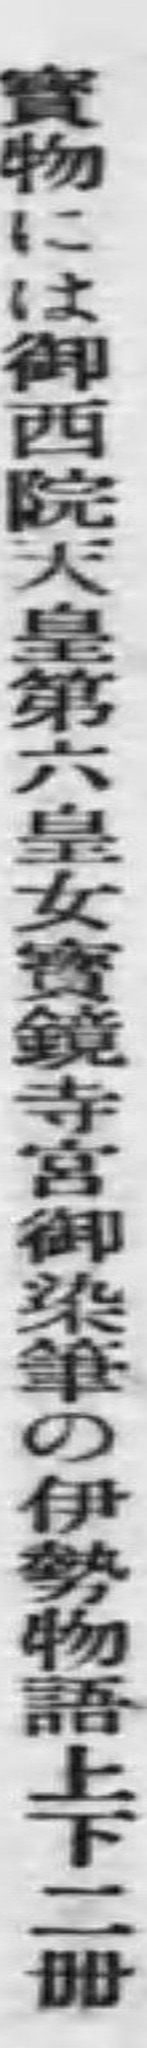宝物には御西院天皇第六皇女宝鏡寺宮御染筆の伊勢物語上下二冊
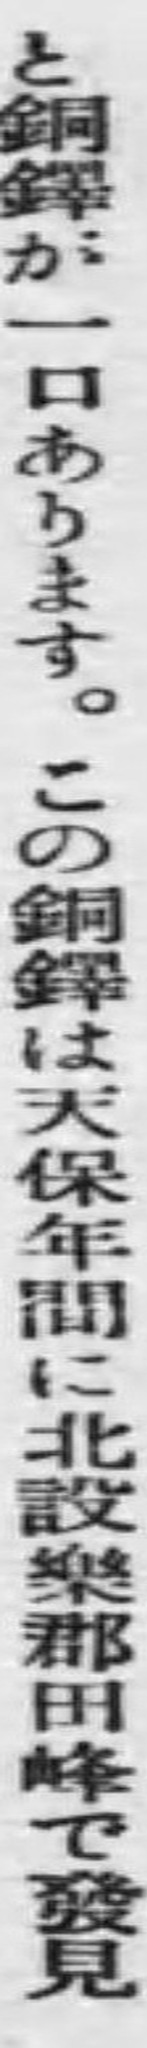と銅鐸が一口あります。この銅鐸は天保年間に北設楽郡田峰で発見
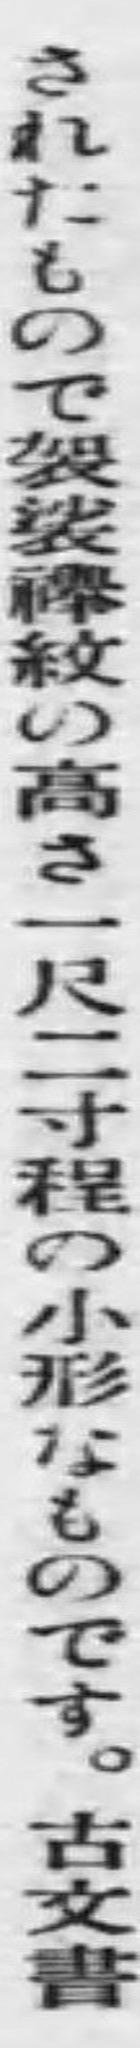されたもので袈裟襷紋の高さ一尺二寸程の小形なものです。古文書
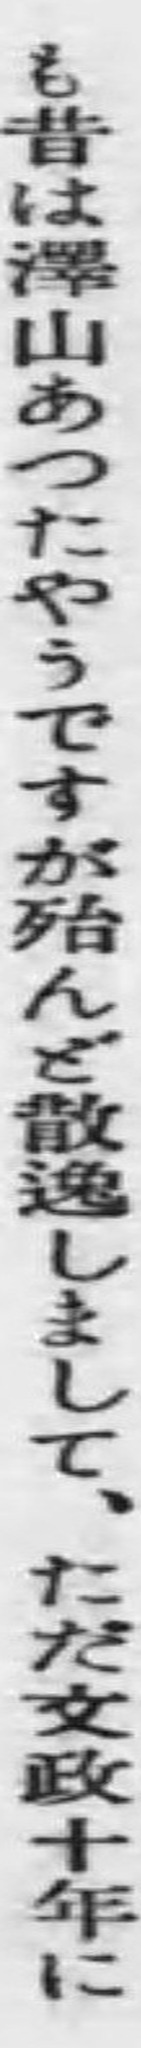も昔は沢山あつたやうですが殆んど散逸しまして、ただ文政十年に
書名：東三河道中記 : 豊橋市及其附近案内
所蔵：国立国会図書館 National Diet Library, JAPAN
